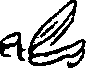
als
